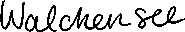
Walchensee
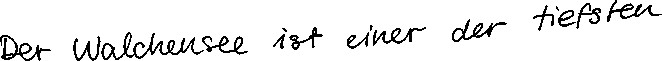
Der Walchensee ist einer der tiefsten
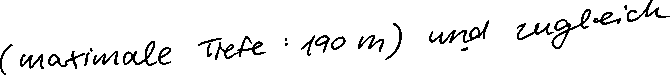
(maximale Tiefe: 190 m) und zugleich
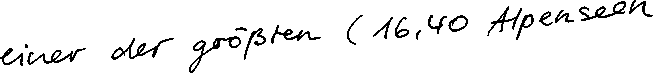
einer der größten (16,40 Alpenseen
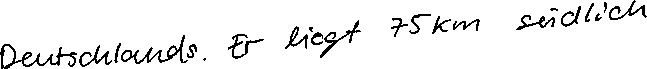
Deutschlands. Er liegt 75 km südlich
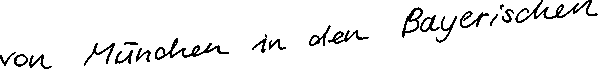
von München in den Bayerischen
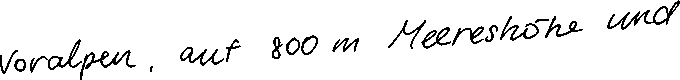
Voralpen, auf 800 m Meereshöhe und
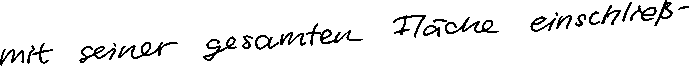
mit seiner gesamten Fläche einschließ-
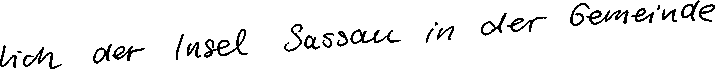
lich der Insel Sassau in der Gemeinde
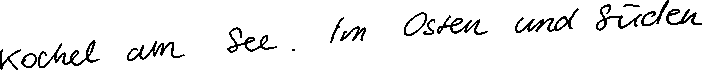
Kochel am See. Im Osten und Süden
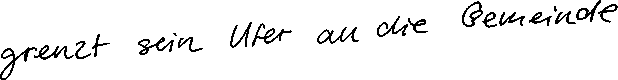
grenzt sein Ufer an die Gemeinde
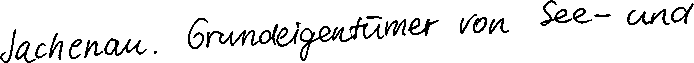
Jachenau. Grundeigentümer von See- und
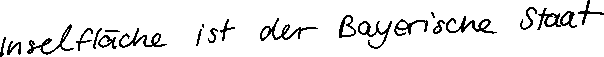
Inselfläche ist der Bayerische Staat
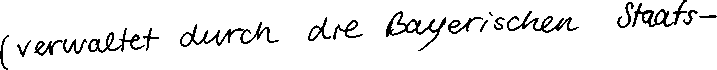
(verwaltet durch die Bayerischen Staats-
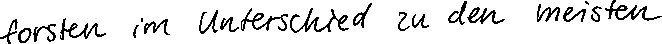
forsten im Unterschied zu den meisten
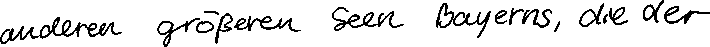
anderen größeren Seen Bayerns, die der
